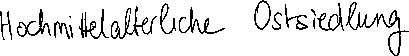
Hochmittelalterliche Ostsiedlung
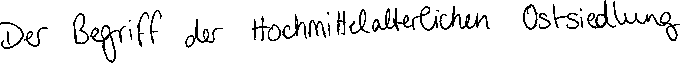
Der Begriff der Hochmittelalterlichen Ostsiedlung
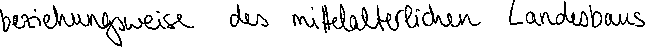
beziehungsweise des mittelalterlichen Landesbaus
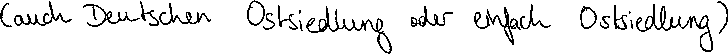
(auch Deutschen Ostsiedlung oder einfach Ostsiedlung)
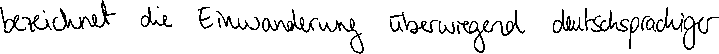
bezeichnet die Einwanderung überwiegend deutschsprachiger
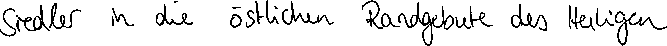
Siedler in die östlichen Randgebiete des Heiligen
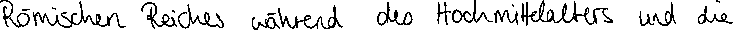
Römischen Reiches während des Hochmittelalters und die
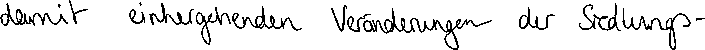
damit einhergehenden Veränderungen der Siedlungs-
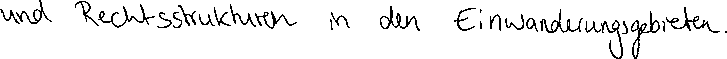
und Rechtsstrukturen in den Einwanderungsgebieten.
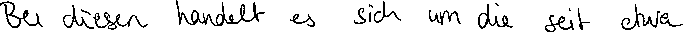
Bei diesen handelt es sich um die seit etwa
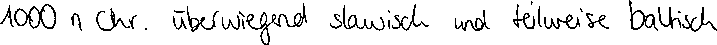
1000 n. Chr. überwiegend slawisch und teilweise baltisch
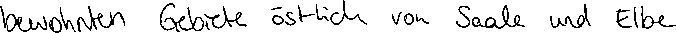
bewohnten Gebiete östlich von Saale und Elbe
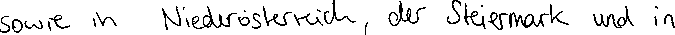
sowie in Niederösterreich, der Steiermark und in
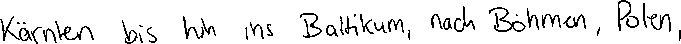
Kärnten bis hin ins Baltikum, nach Böhmen, Polen,
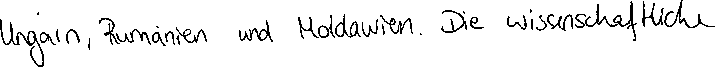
Ungarn, Rumänien und Moldawien. Die wissenschaftliche
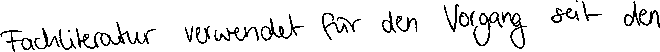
Fachliteratur verwendet für den Vorgang seit den
